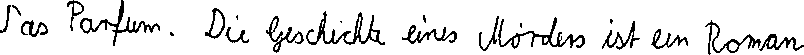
Das Parfum. Die Geschichte eines Mörders ist ein Roman
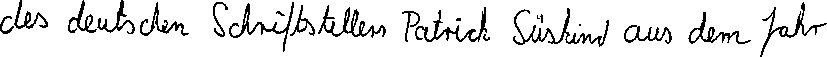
des deutschen Schriftstellers Patrick Süskind aus dem Jahr
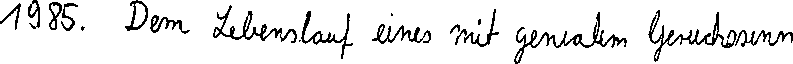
1985. Dem Lebenslauf eines mit genialem Geruchssinn
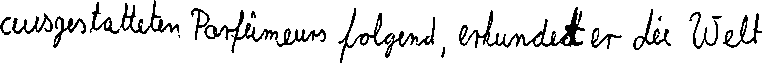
ausgestatteten Parfümeurs folgend, erkundet er die Welt
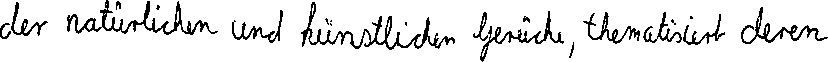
der natürlichen und künstlichen Gerüche, thematisiert deren
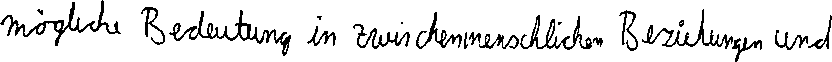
mögliche Bedeutung in zwischenmenschlichen Beziehungen und
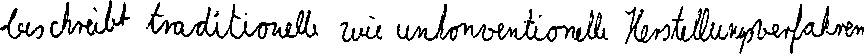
beschreibt traditionelle wie unkonventionelle Herstellungsverfahren
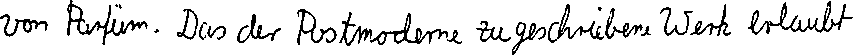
von Parfum. Das der Postmoderne zugeschriebene Werk erlaubt
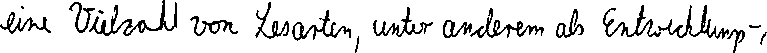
eine Vielzahl von Lesarten, unter anderem als Entwicklungs-,
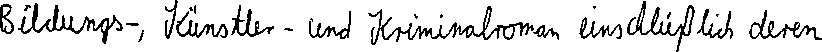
Bildungs-, Künstler- und Kriminalroman einschließlich deren
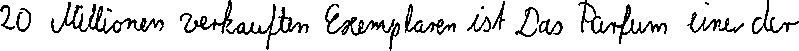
20 Millionen verkauften Exemplaren ist Das Parfum einer der
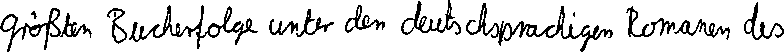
größten Bucherfolge unter den deutschsprachigen Romanen des
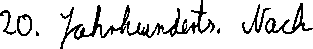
20. Jahrhunderts. Nach
